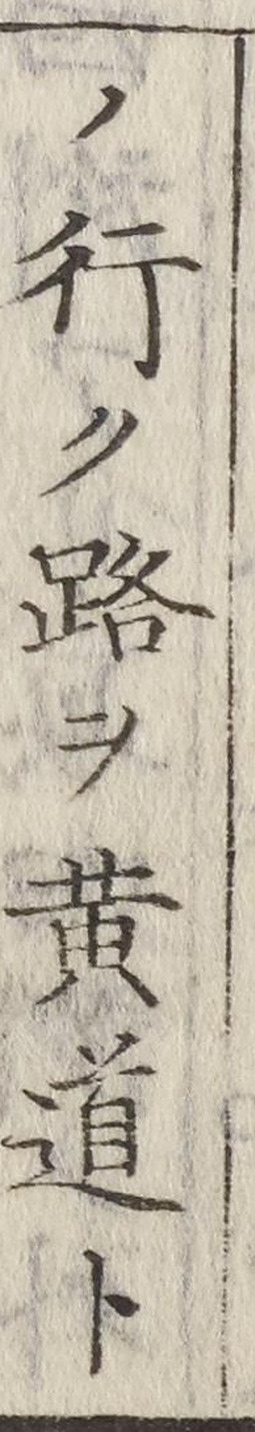ノ行ク路ヲ黄道ト
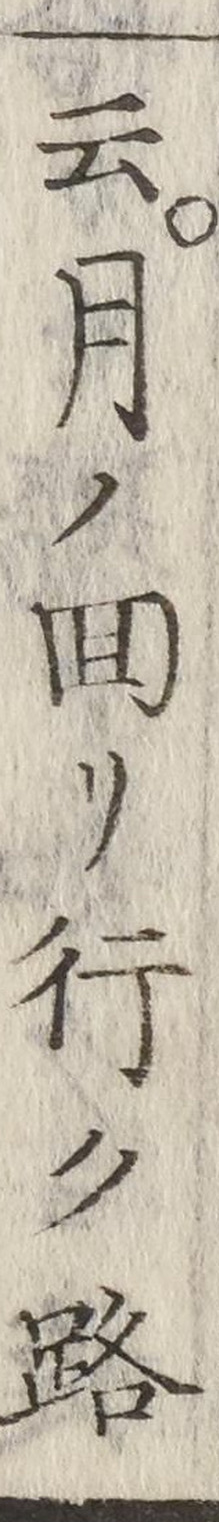云。月ノ回リ行ク路
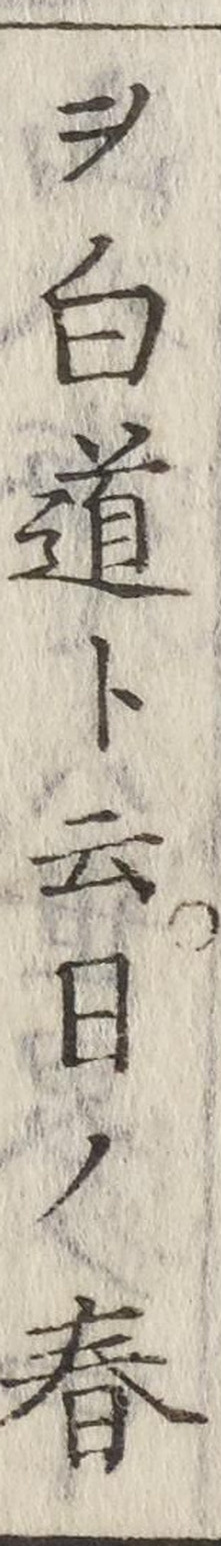ヲ白道ト云。日ノ春
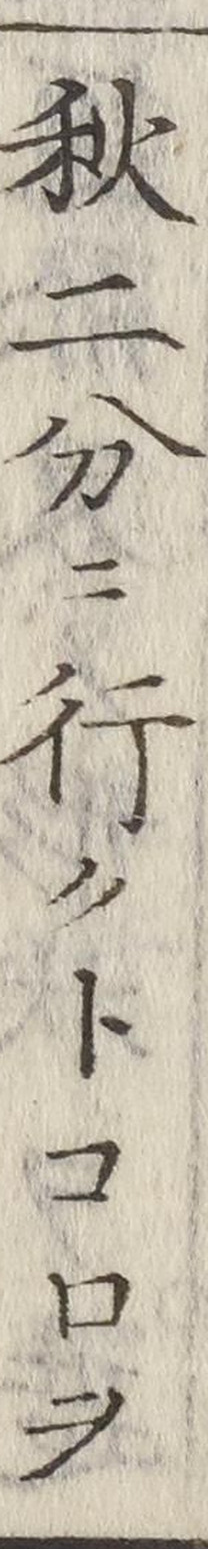秋二分ニ行クトコロヲ
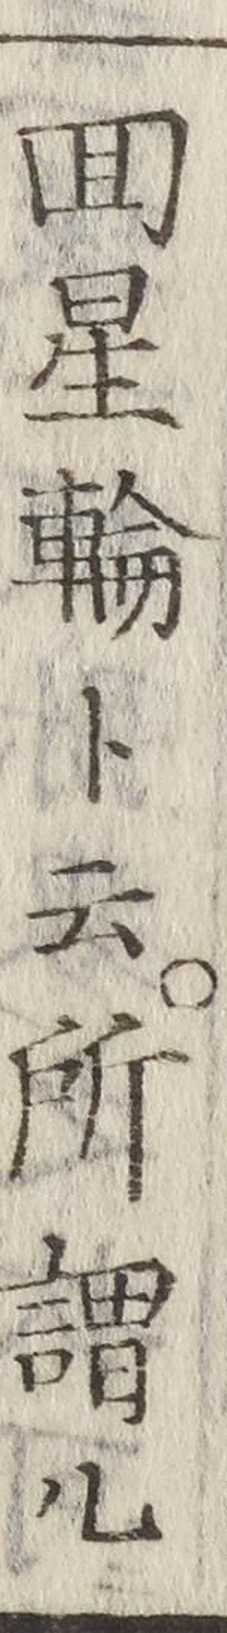回星輪ト云。所謂ル
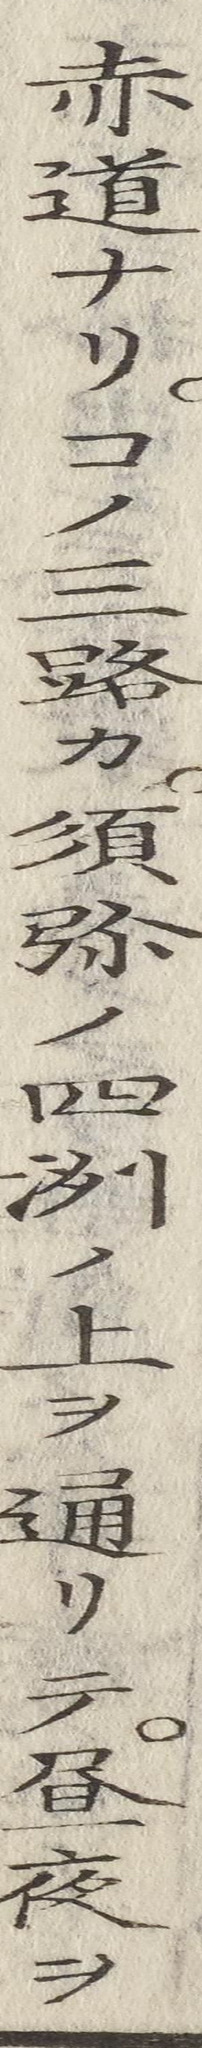赤道ナリ。コノ三路カ。須弥ノ四洌ノ上ヲ通リテ。昼夜ヲ
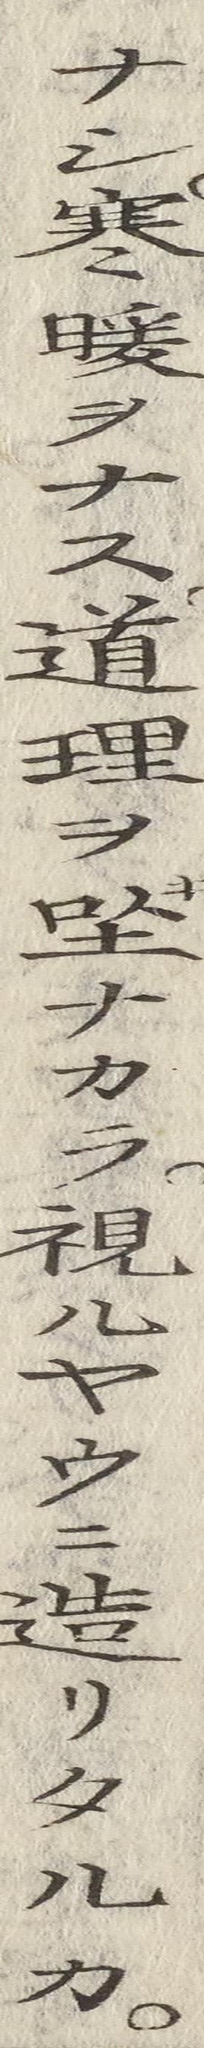ナシ。寒暖ヲナス。道理ヲ坐ナカラ。視ルヤウニ造リタルカ。
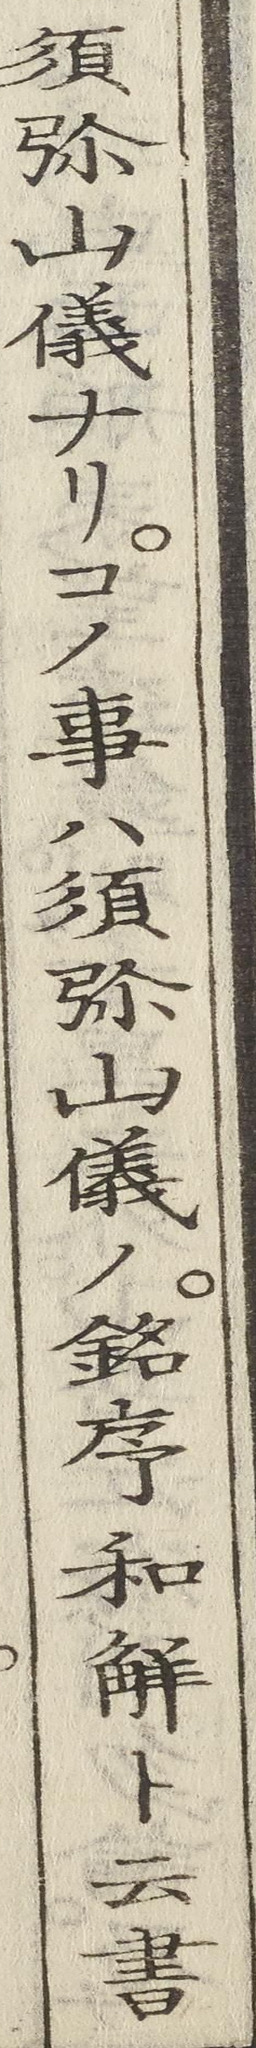須弥山儀ナリ。コノ事ハ須弥山儀ノ。銘序和解ト云書
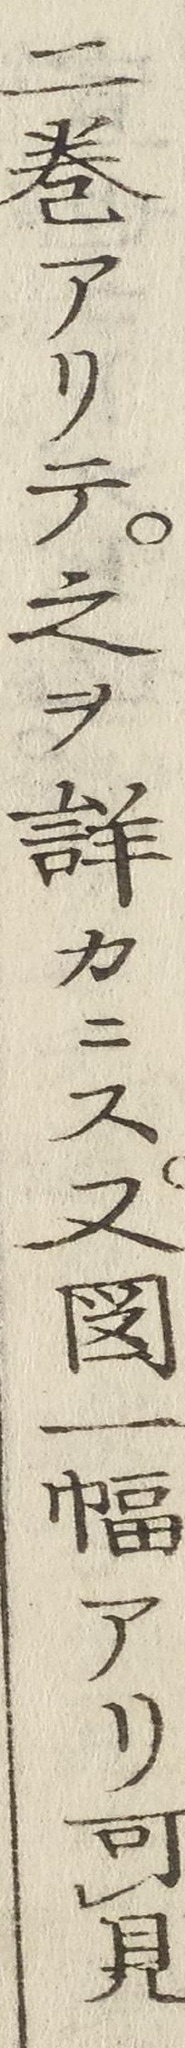二巻アリテ。之ヲ詳カニス。又図一幅アリ可見。
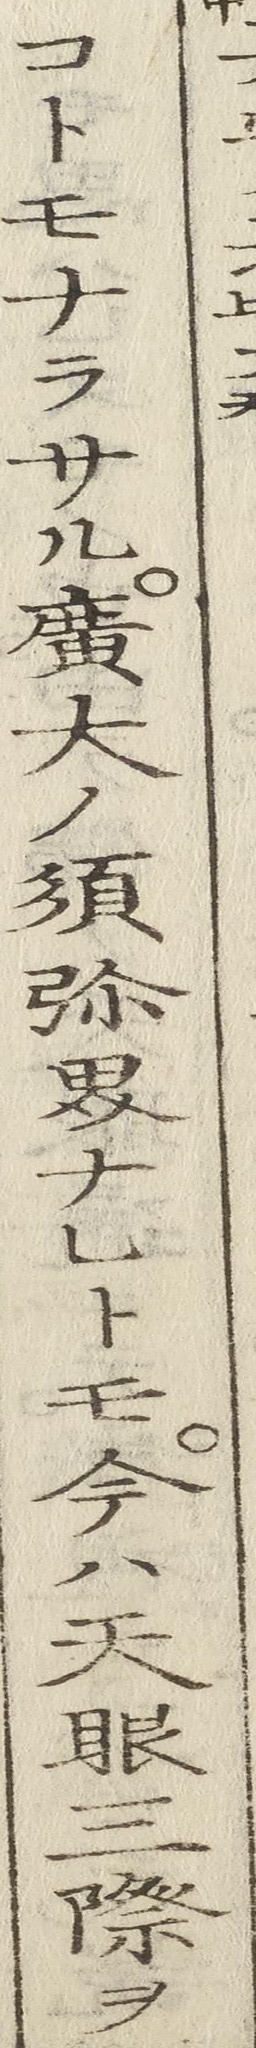コトモナラサル。広大ノ須弥界ナレトモ。今ハ天眼三際ヲ
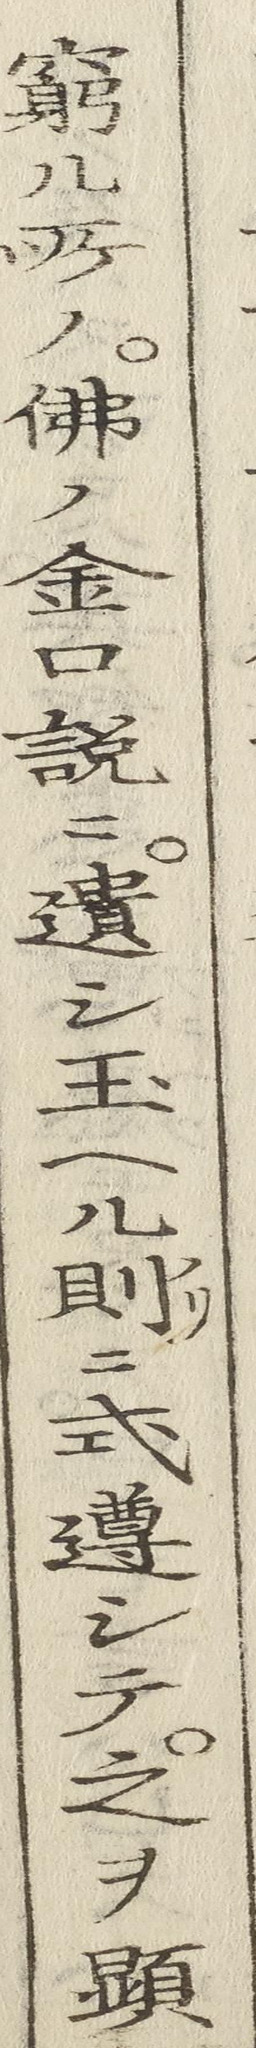窮ル所ノ。仏ノ金口説ニ。遺シ玉ヘル則ニ式遵シテ。之ヲ顕
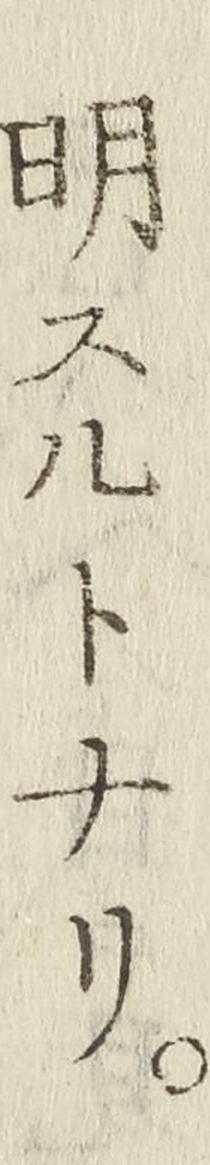明スルトナリ。
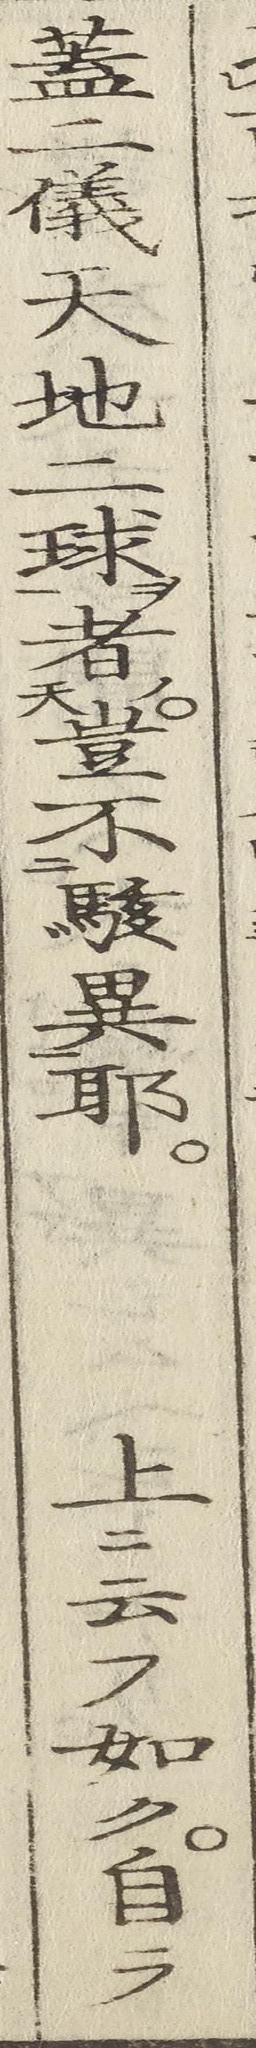蓋二儀天地二球者。豈不駭異耶。上ニ云フ如ク。自ラ
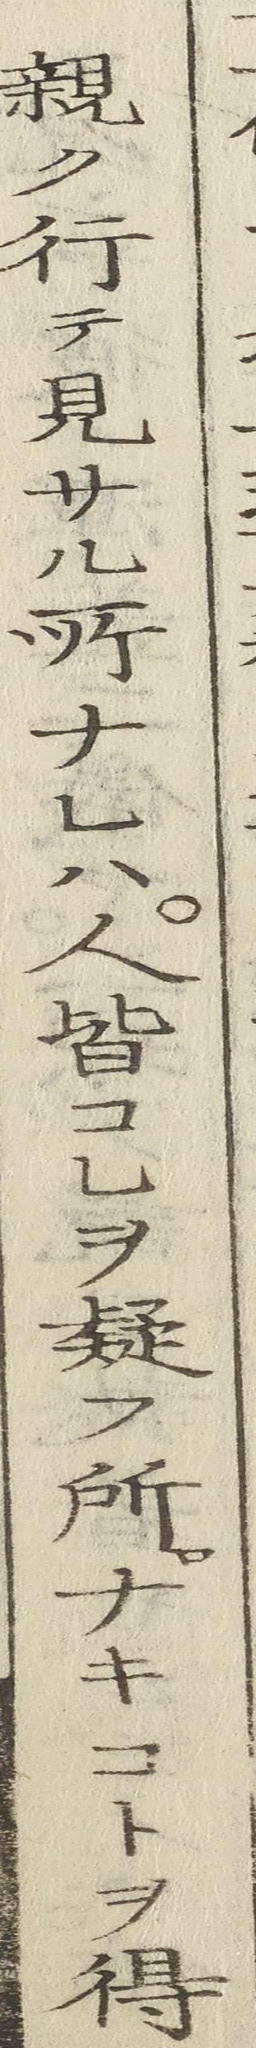親ク行テ見サル所ナレハ。人皆コレヲ疑フ所ナキコトヲ得

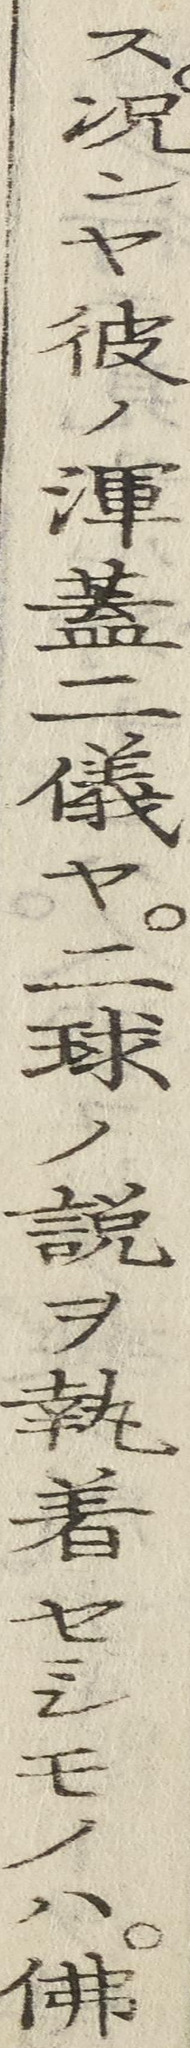ス。況ンヤ彼ノ渾蓋二儀ヤ。二球ノ説ヲ執着セシモノハ。仏
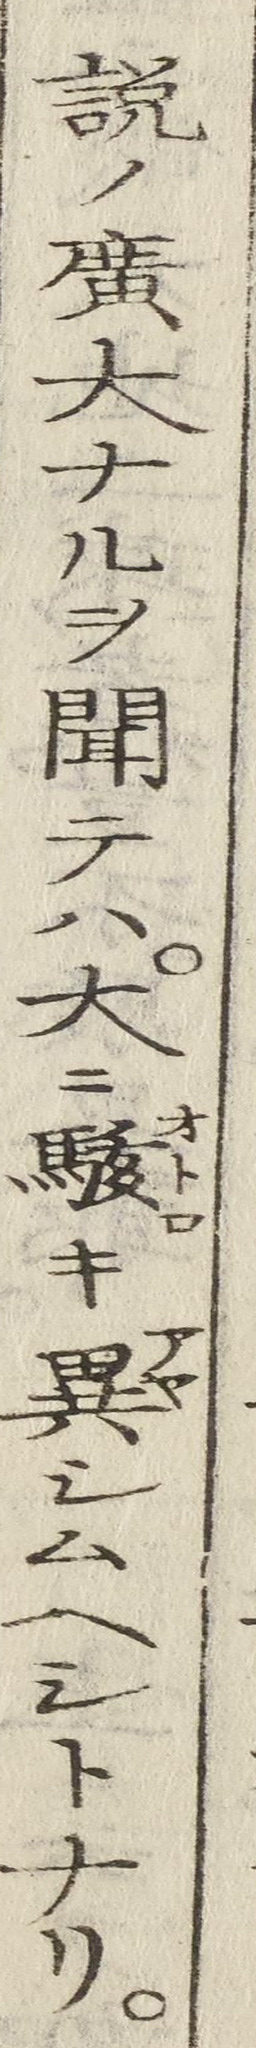説ノ広大ナルヲ聞テハ。大ニ駭キ異シムヘシトナリ。
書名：護法新論　上
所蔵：東京大学地震研究所図書室 Earthquake Research Institute Library, The University of Tokyo, JAPAN
